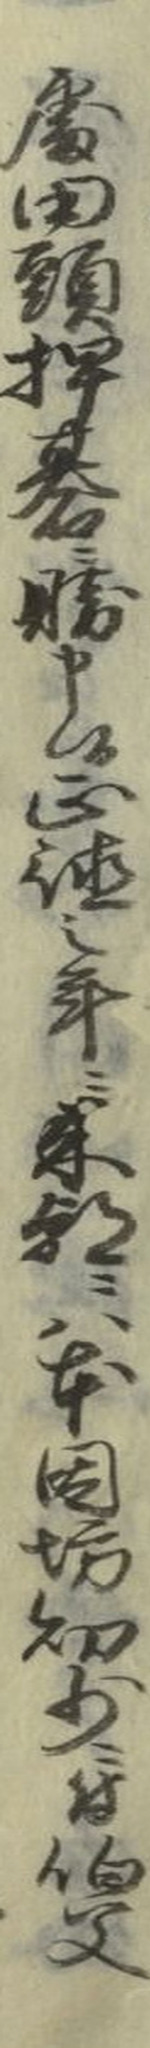處田頭押碁勝申候正徳の年に来朝には本因坊幼少に付伯父
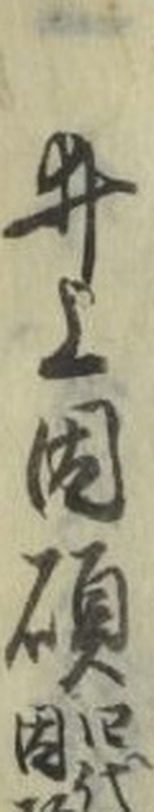井上因碩
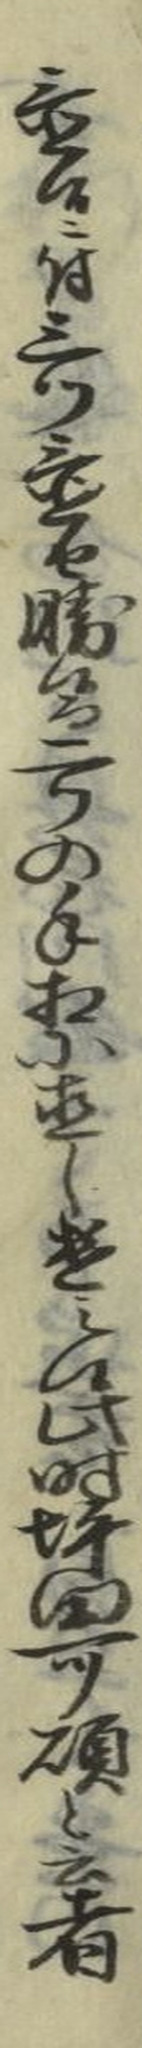置候に付三ッ置せ勝候而二ッの手相に直し遣し候此時坪田可碩と云者
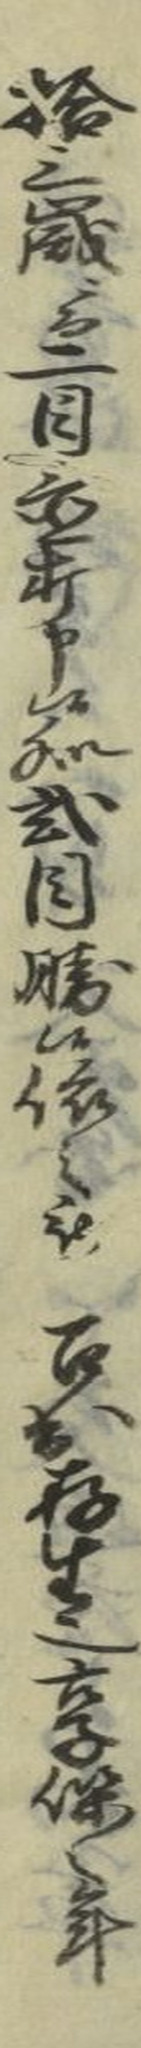拾三歳に而二目置打申候処二目勝候依之被召出存生也享保之年
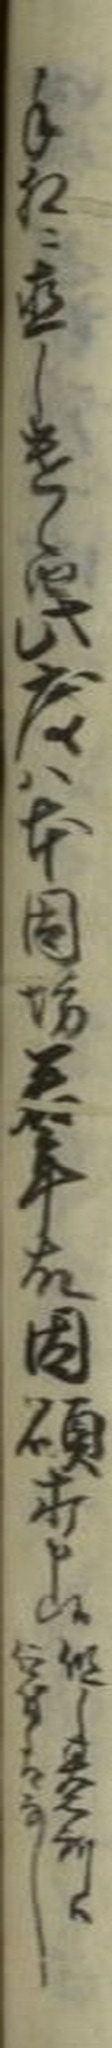手相に直し遣候由此度は本因坊若年故因碩打申候但し碁所なし
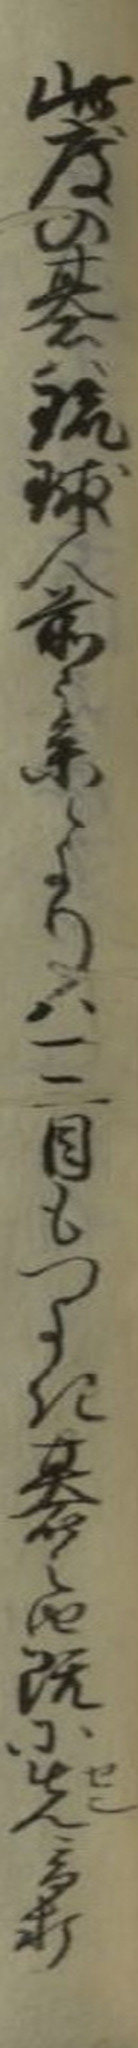此度の碁は琉球人前に参候よりは一二目もつよき碁之由既に先に而打
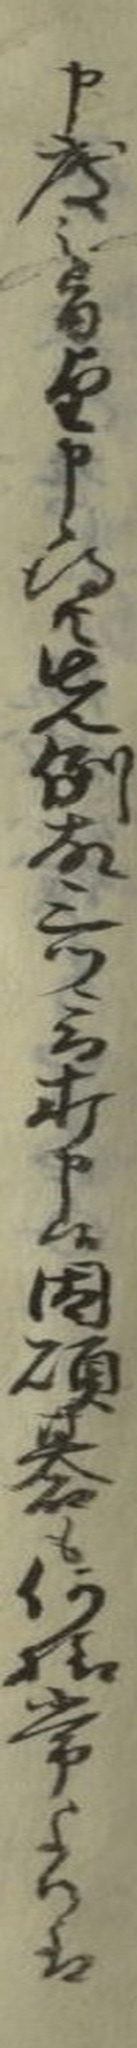申度之旨重申候得共先例故三ッに而打申候因碩碁も何様常よりは
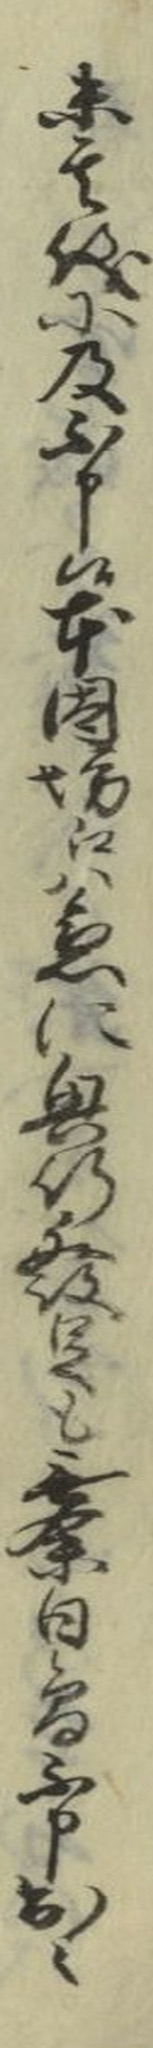未其儀に及不申候本因坊えは急に興行発足も無余白候間不申出之
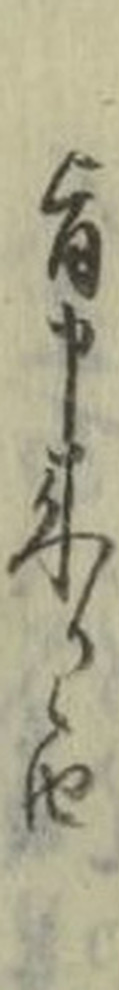旨申来り候由
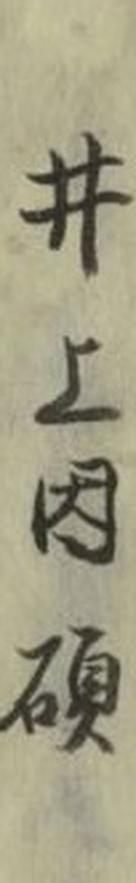井上因碩
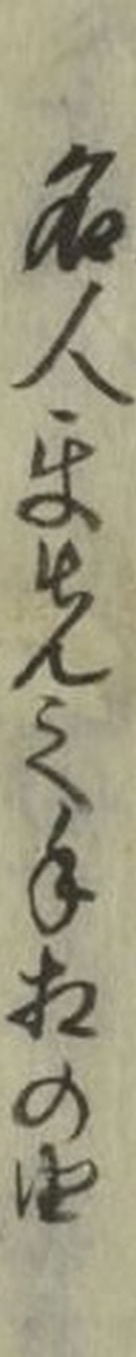名人楽先之手相の由
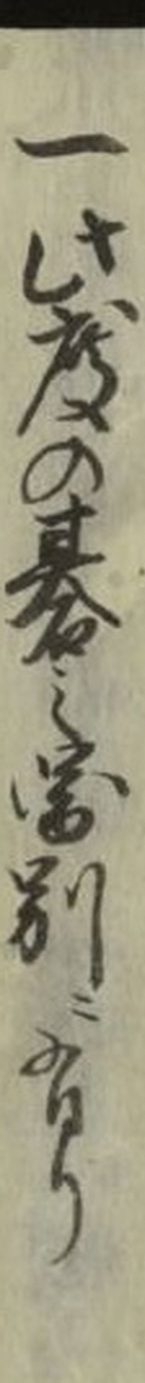一此度の碁之図別に有り

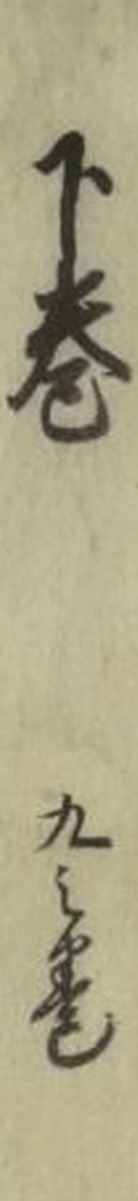下巻九之巻
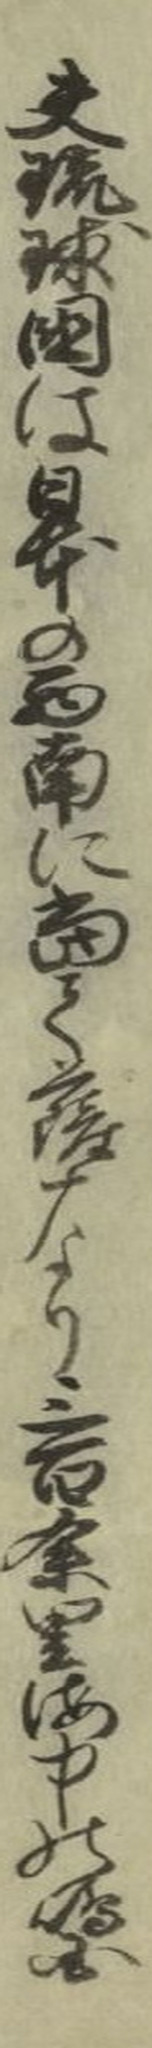夫琉球国は日本の西南に当て薩摩より三百余里海中の嶋国
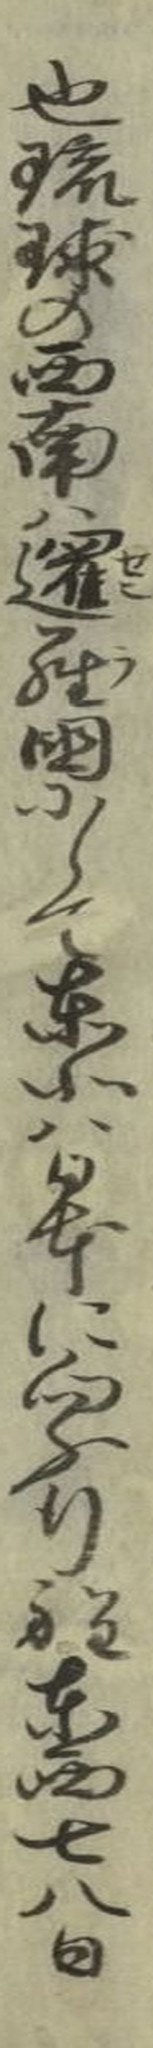也琉球の西南は暹羅国にして東北は日本に向ふ行程東西七八日
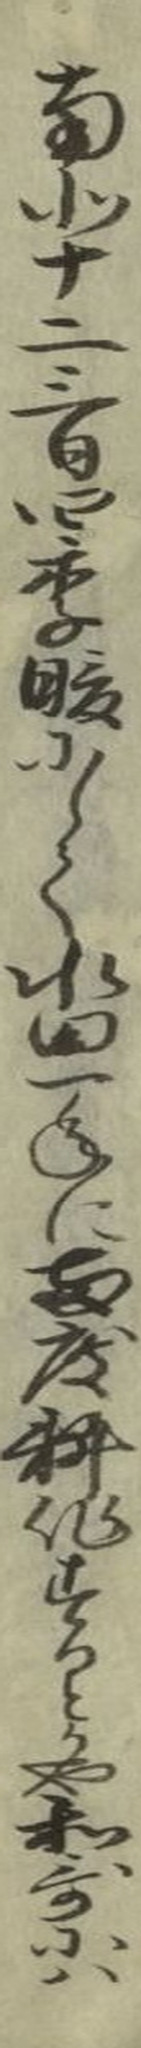南北十二三日四季暖にして水田一年に両度耕作するとかや和歌には
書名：琉球人来朝之記
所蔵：University of the Ryukyus Library
